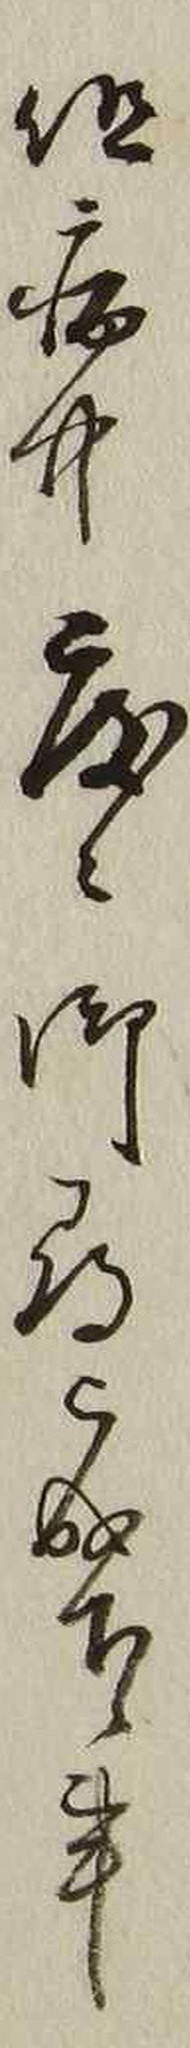但病中度々御尋被成下候事
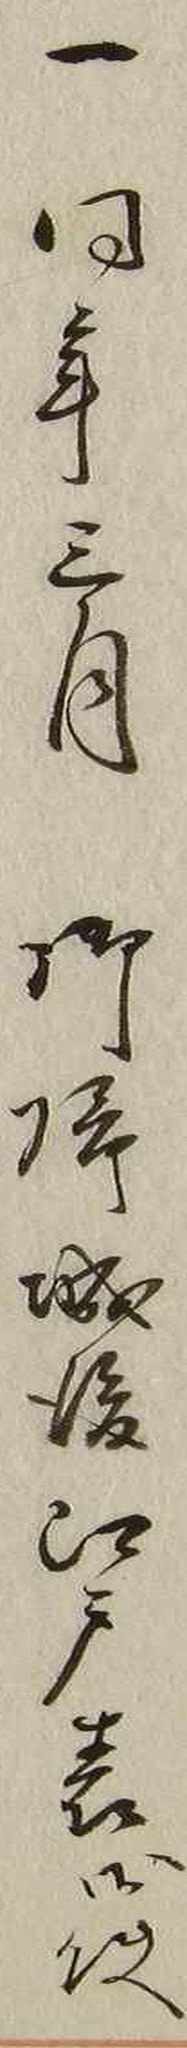一同年三月御帰城後江戸表へ御使
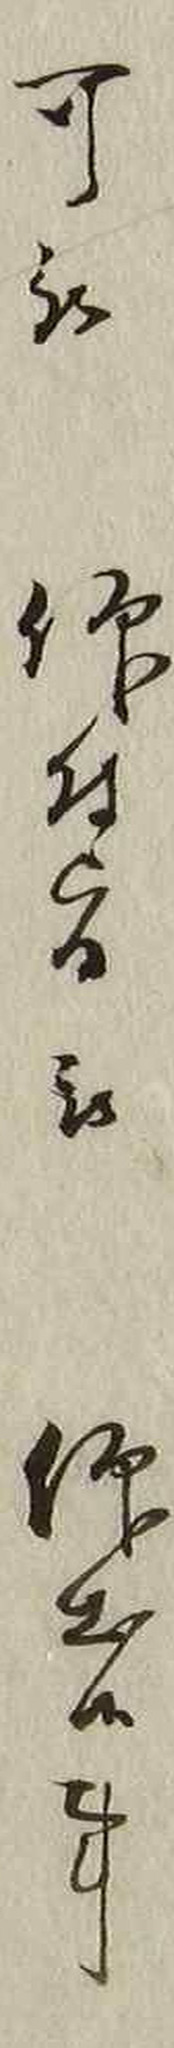可被仰付旨被仰出候事
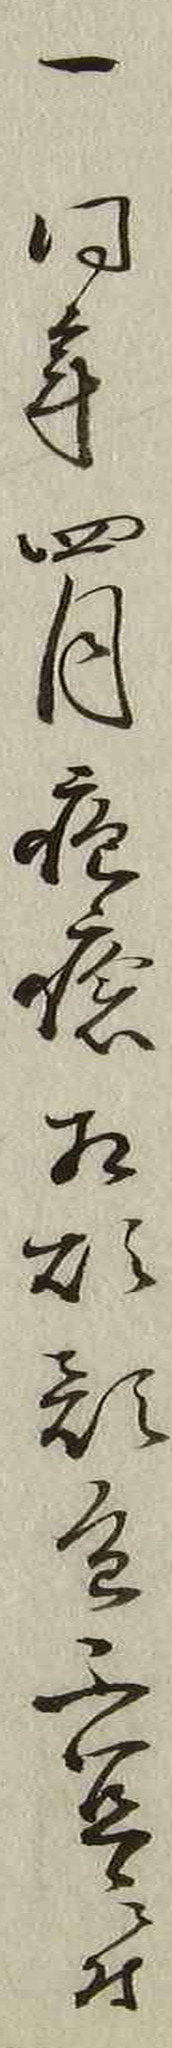一同年四月疱瘡相煩顔色不足に付
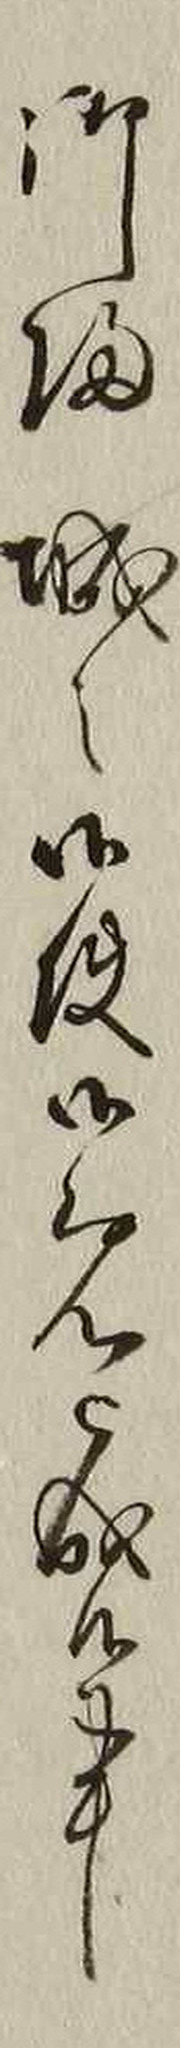御帰城之御使御免被成候事
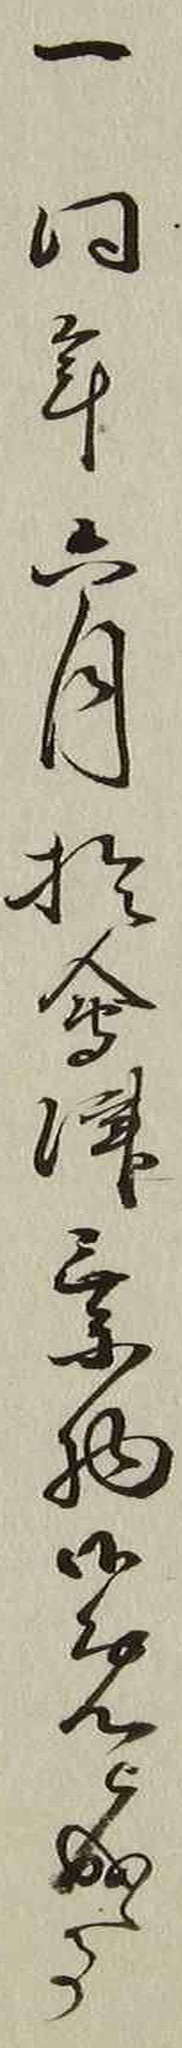一同年六月於会津乗物御免被成候事
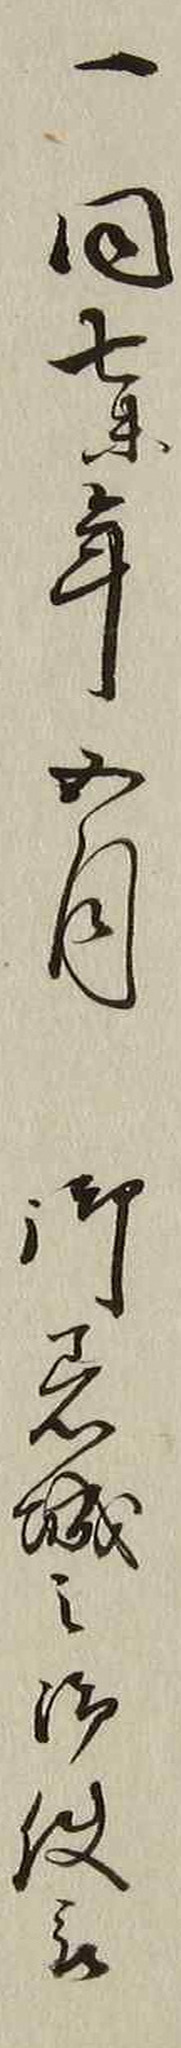一同七未年五月御着城之御使被
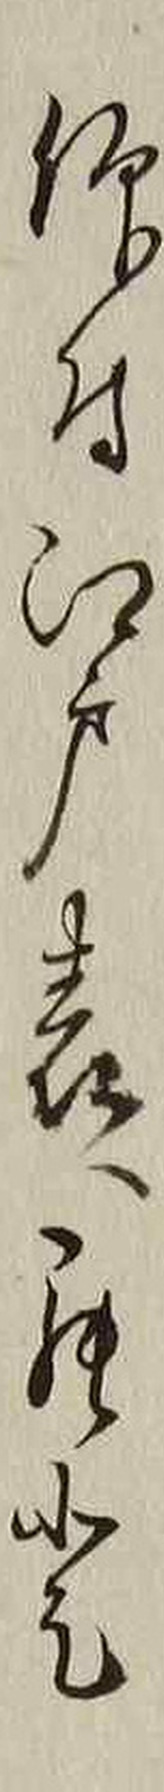仰付江戸表へ罷登
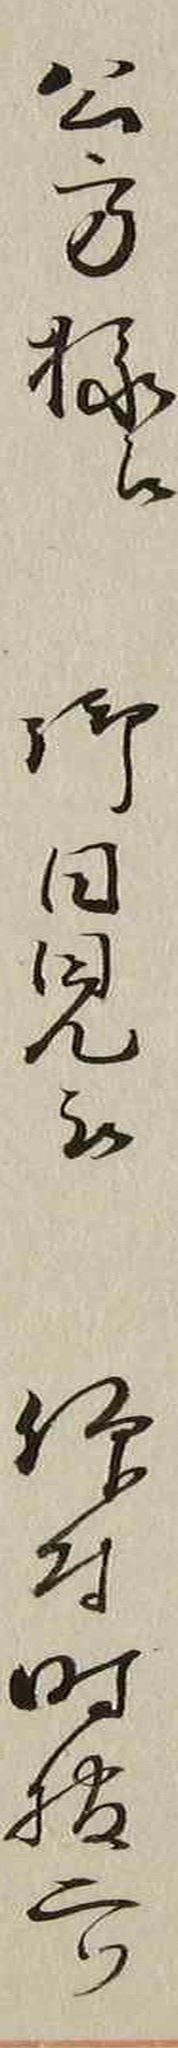公方様江御目見被仰付時服二つ
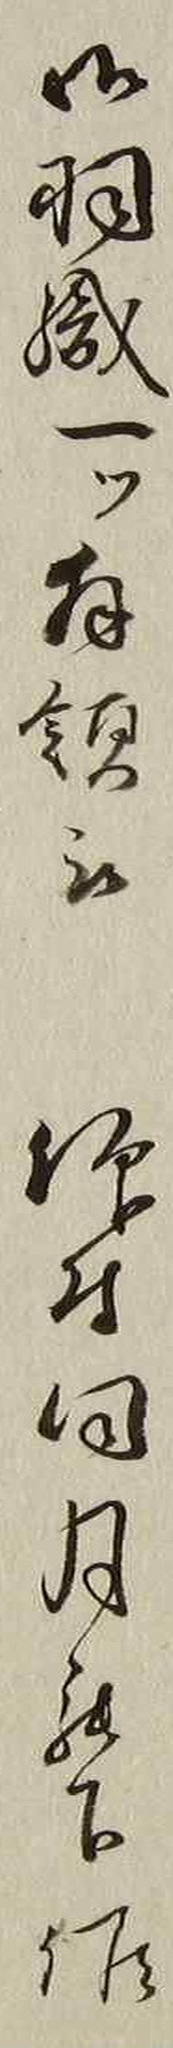御羽織一つ拝領被仰付同月罷下候
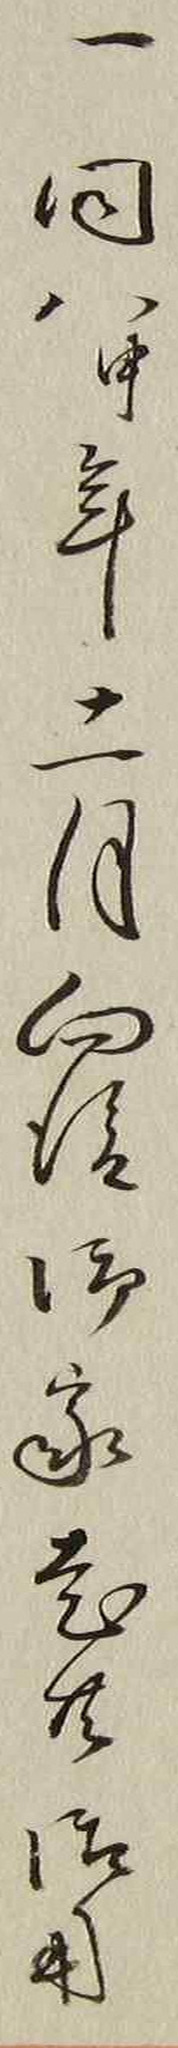一同八申年十一月向後御家老共御用
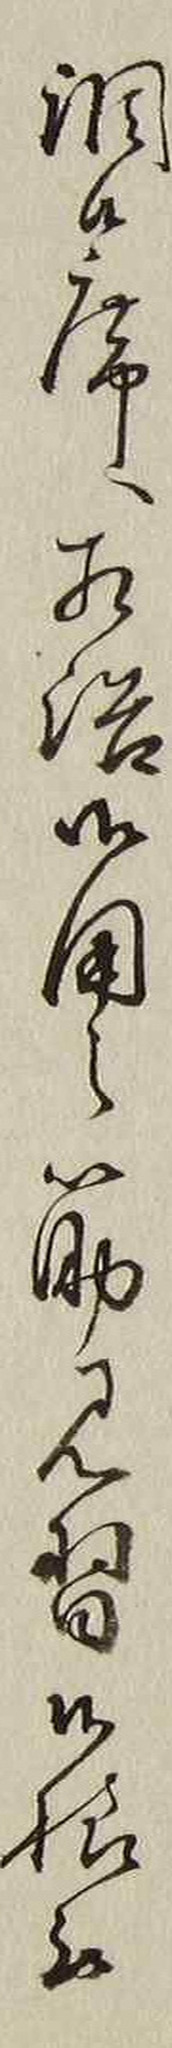調候席へ相詰御用之筋見習候様被
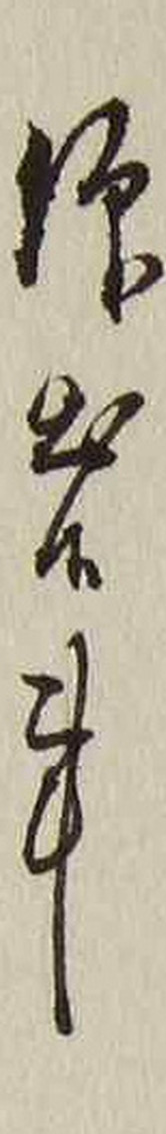仰出候事
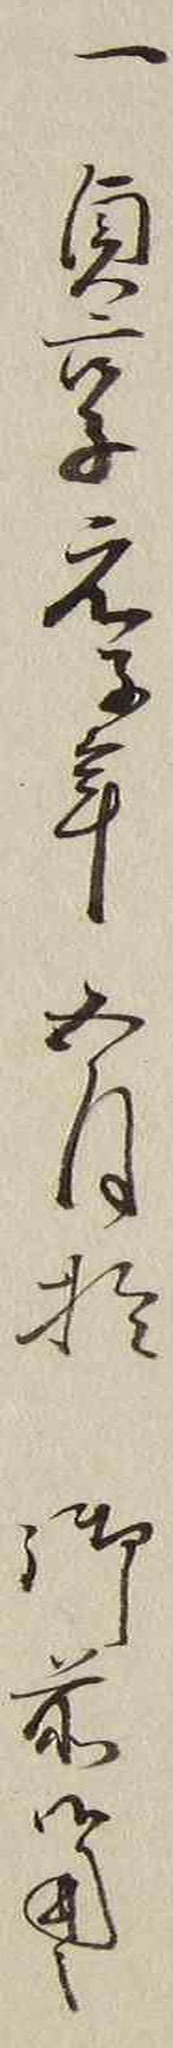一貞享元子年五月於御前御用之
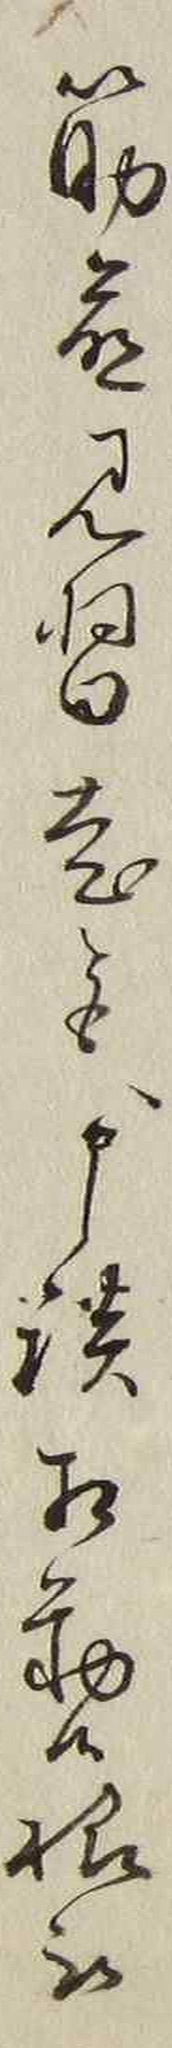筋置見習老ともへ申談相勤候様被

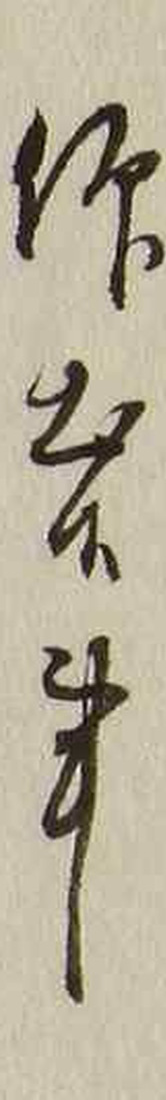仰出候事
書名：諸士系譜　巻之159　な之部1
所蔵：会津若松市立会津図書館
